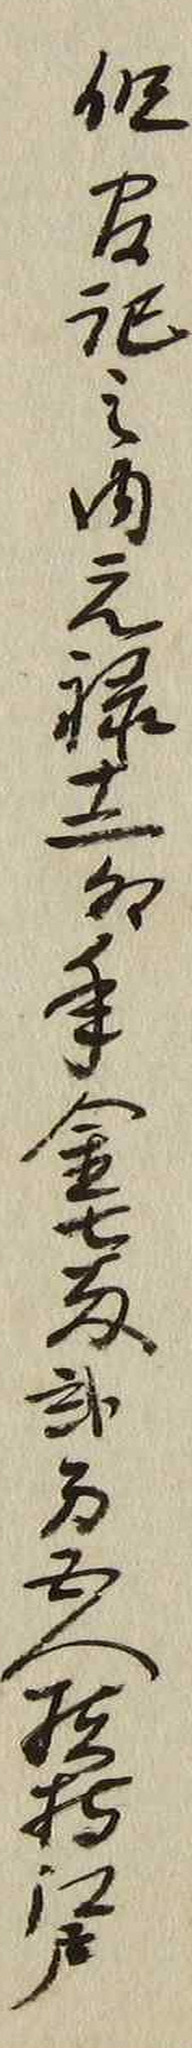但官記之内元禄十二卯年金七両弐分五人扶持江戸
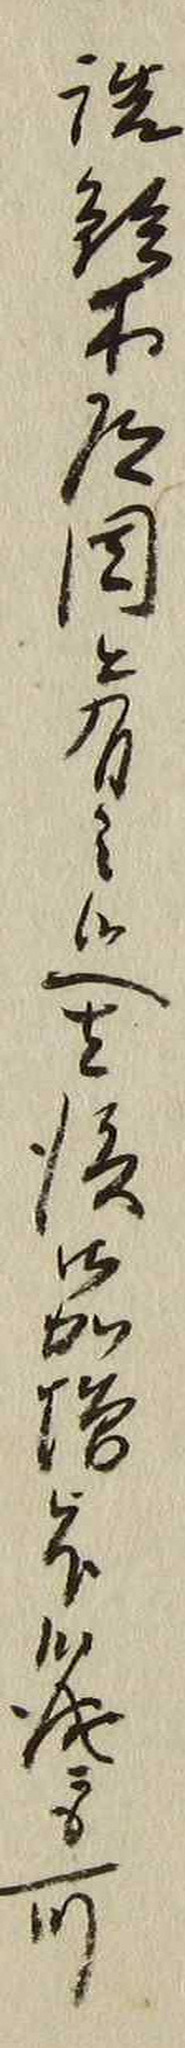詰鈴木道園と有之候へは後御加増被下候儀ニも可
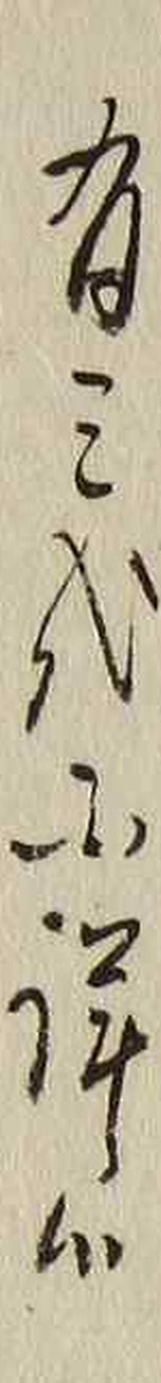有之哉不詳候
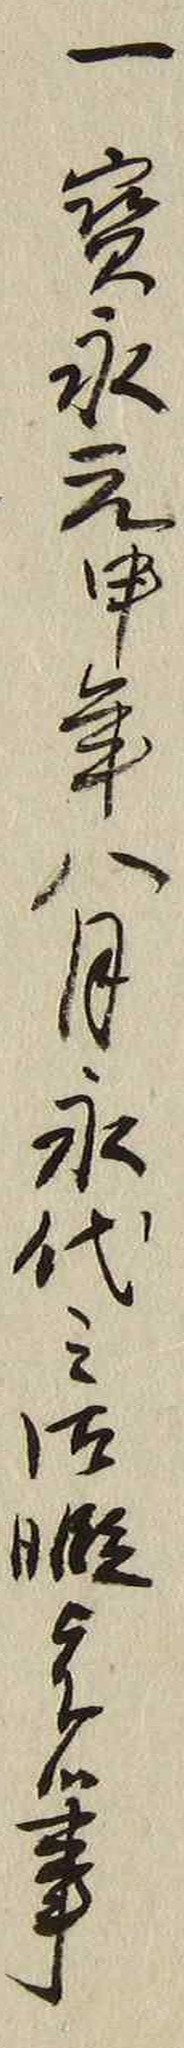一宝永元申年八月永代之御暇被下候事
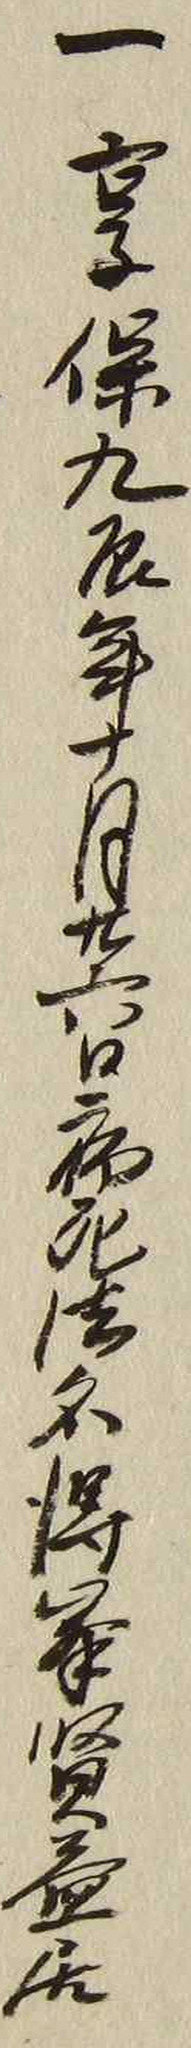一享保九辰年十月廿六日病死法名得峯賢益居
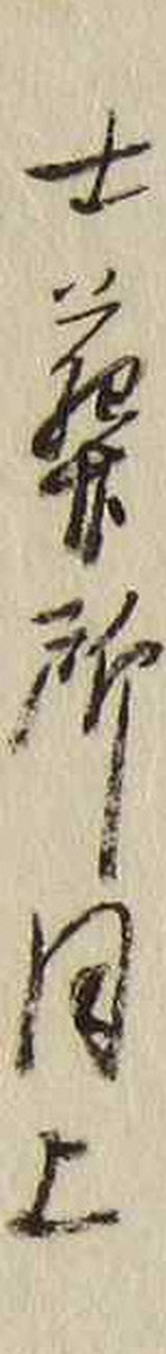士葬所同上

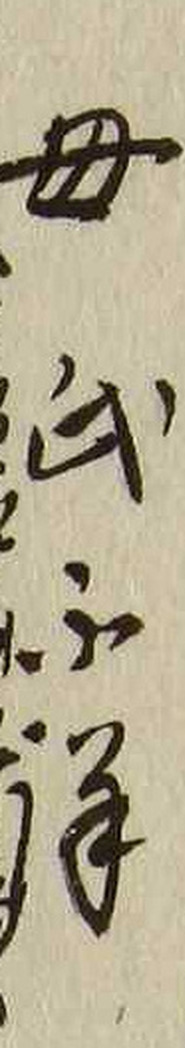母氏不詳
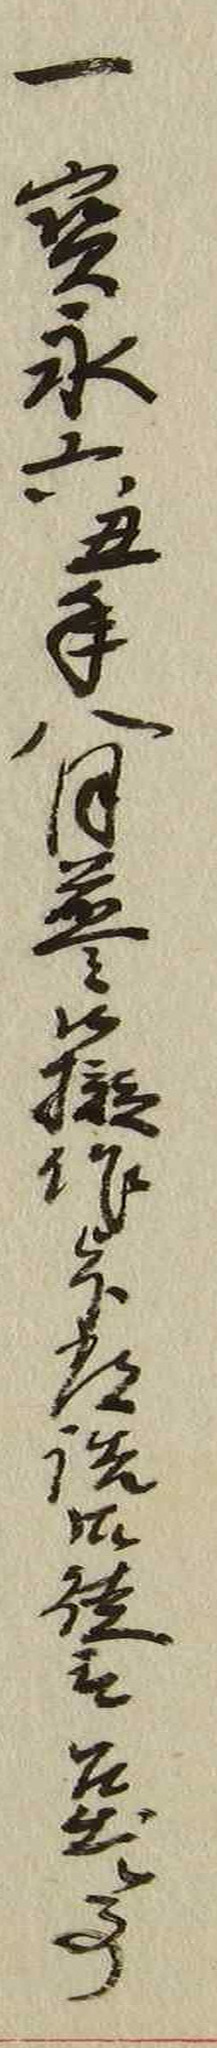一宝永六丑年八月並之御擬作被下常詰御徒被召出候事
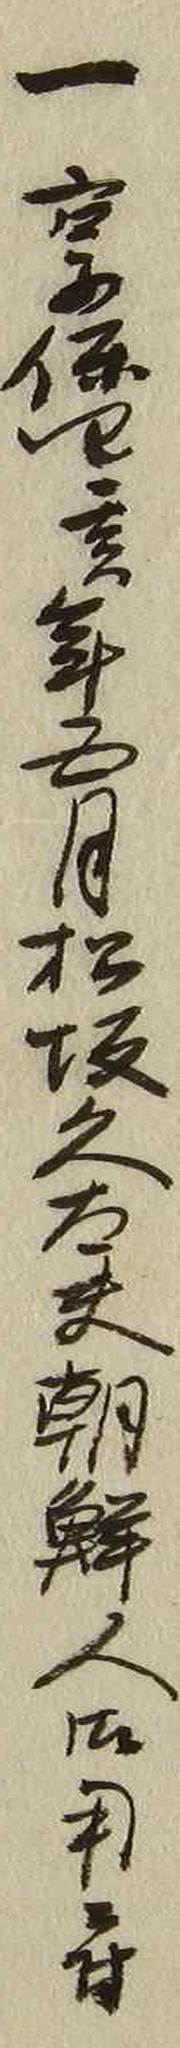一享保四亥年五月松坂久太夫朝鮮人御用ニ付
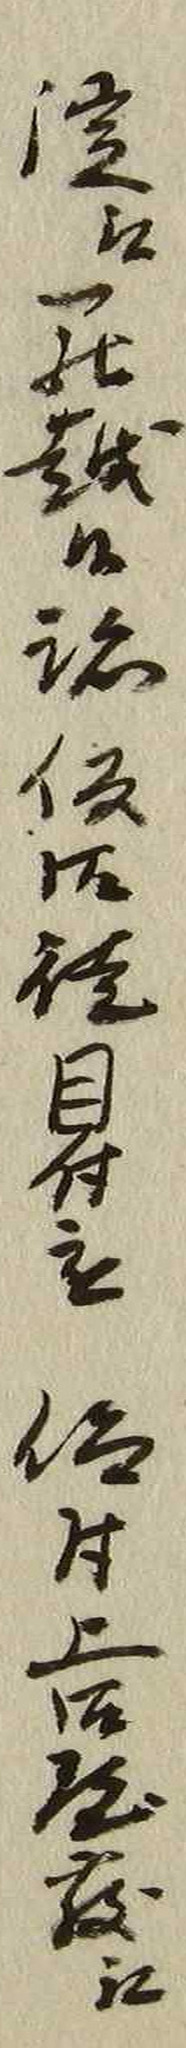浜江罷越候跡仮御徒目付被仰付上御屋敷江
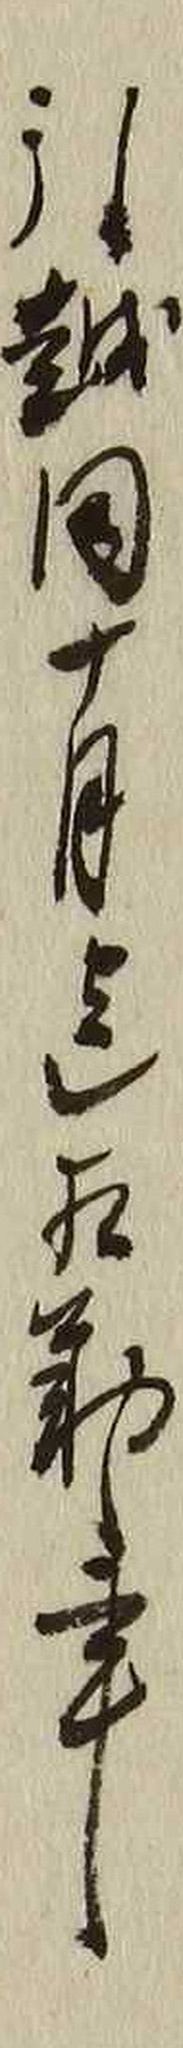引越同十月迄相勤候事
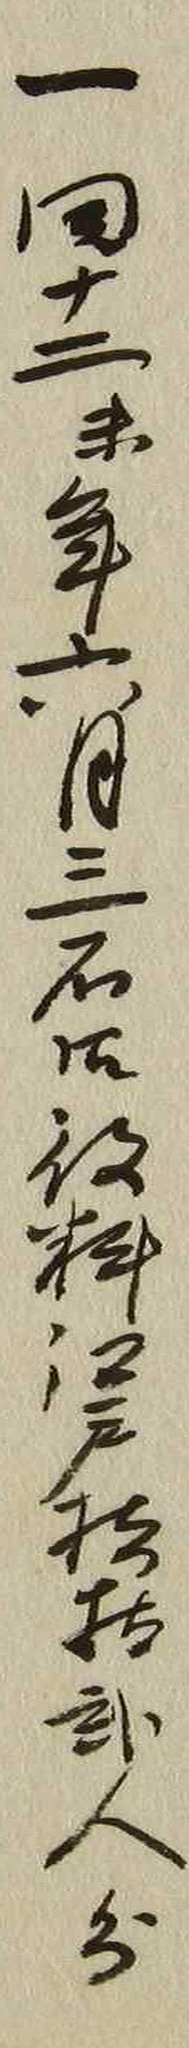一同十二未年六月三石御役料江戸扶持弐人分
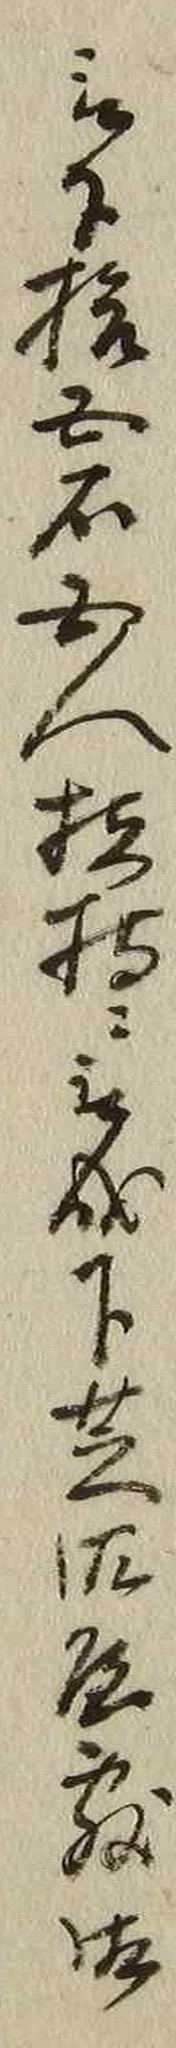被下拾五石五人扶持ニ被成下芝御屋敷御
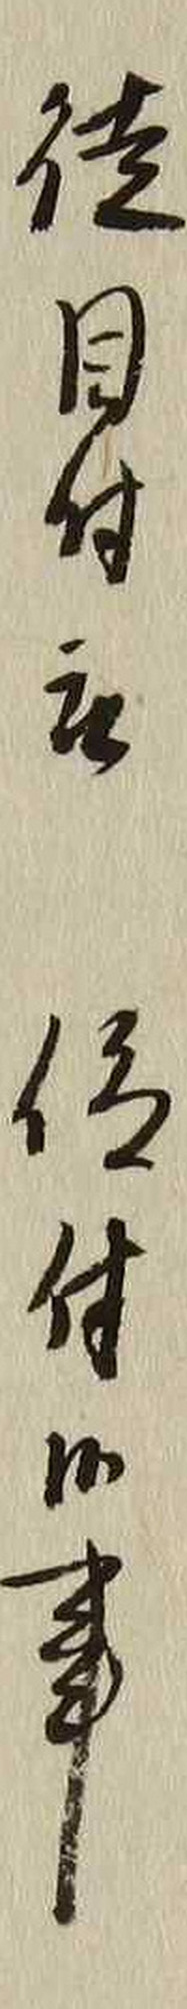徒目付被仰付候事
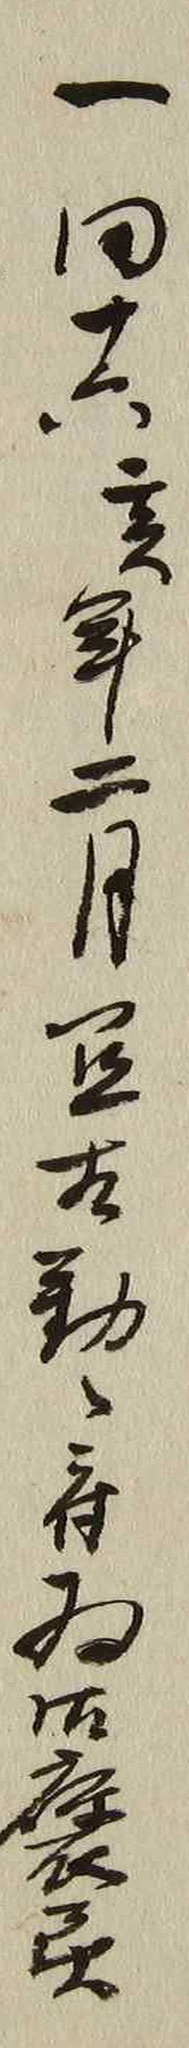一同十六亥年二月宜相勤候ニ付為御褒美
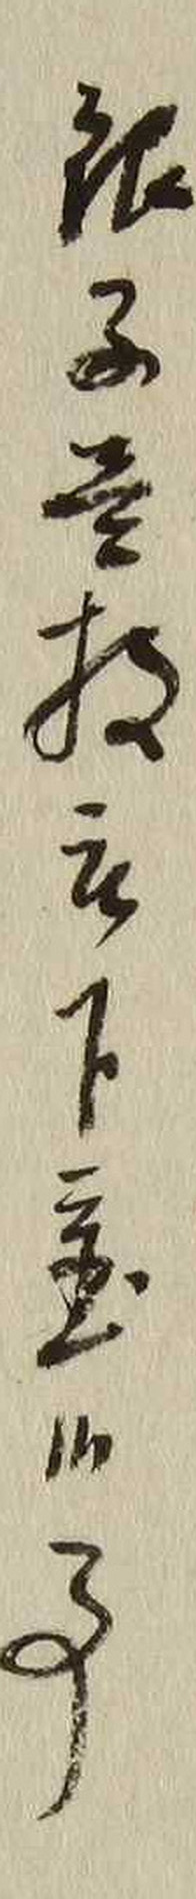銀子壱枚被下置候事
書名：諸士系譜　巻之353　す之部3
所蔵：会津若松市立会津図書館
